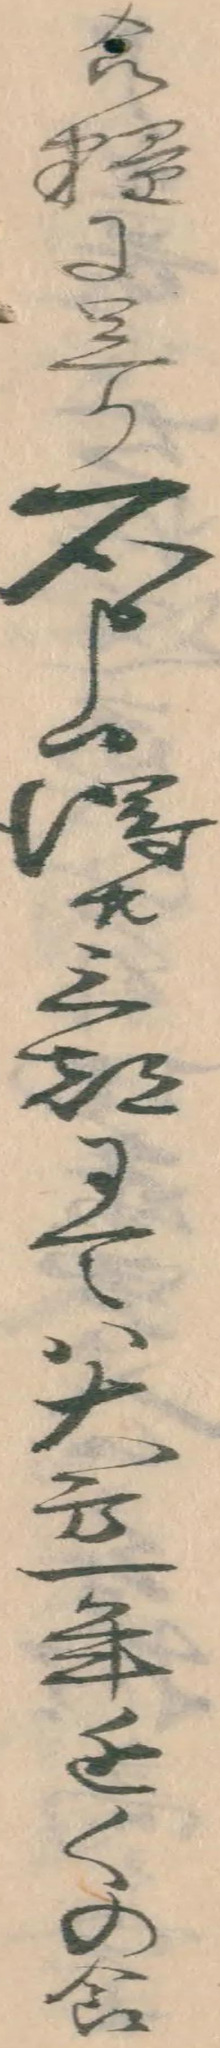食糧に足り不申候得共三都にては大方一年近くの食
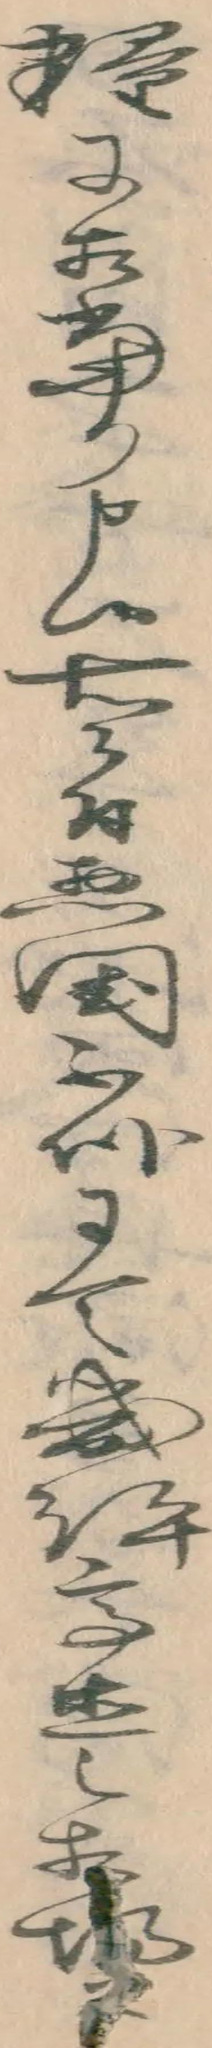糧に相当り申候右に付惣国不作にて幾許高直之相場
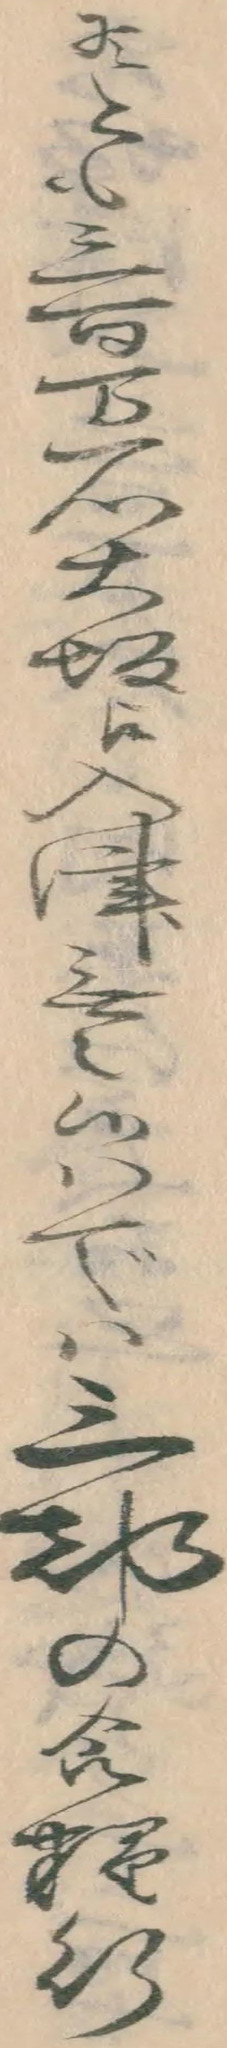候とも三百万石大坂え入津無之候はでは三都の食糧行
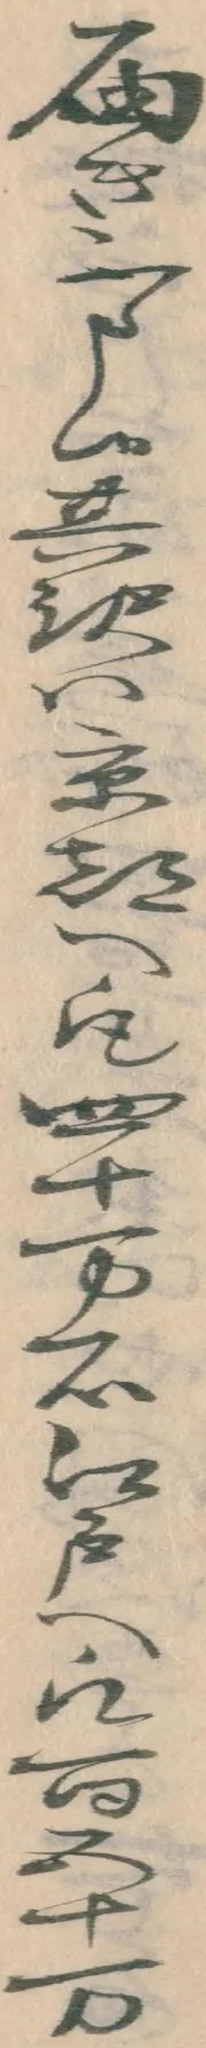届き不申候其訳は京都へ凡四十万石江戸へ凡百五十万
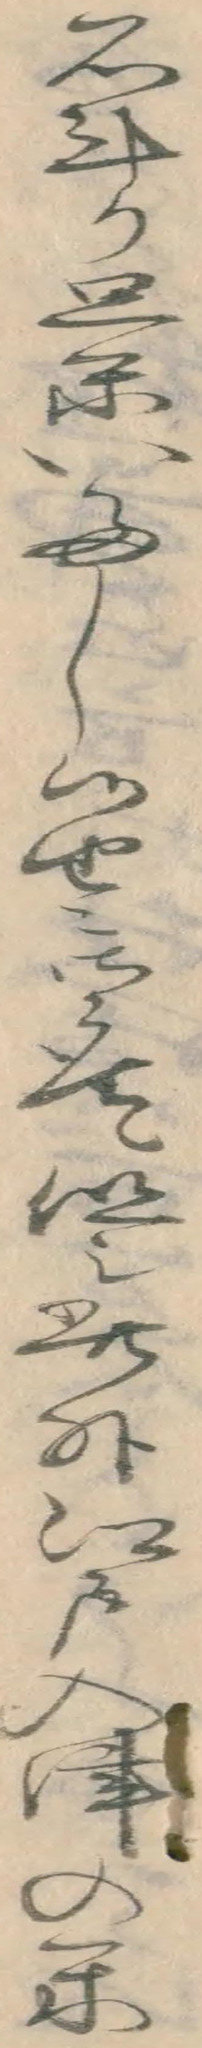石計り廻米いたし候由に御座候但し此外江戸入津の米
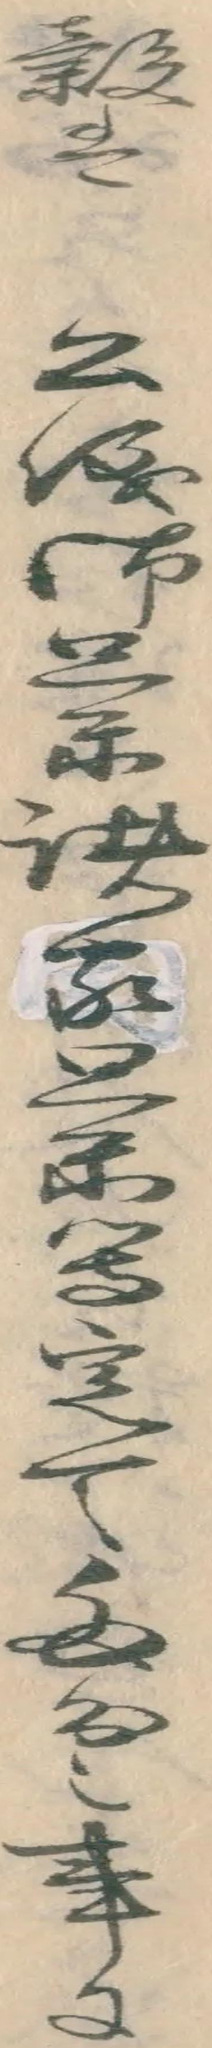穀は公儀御廻米諸家廻米等定て多分之事に
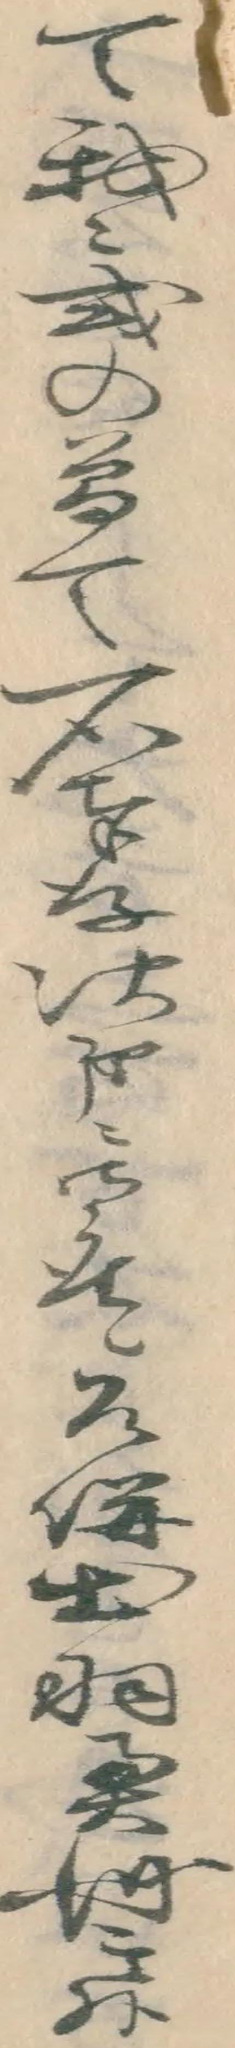て我々式の曽て不奉存次第に御座候乍併出羽奥州其外
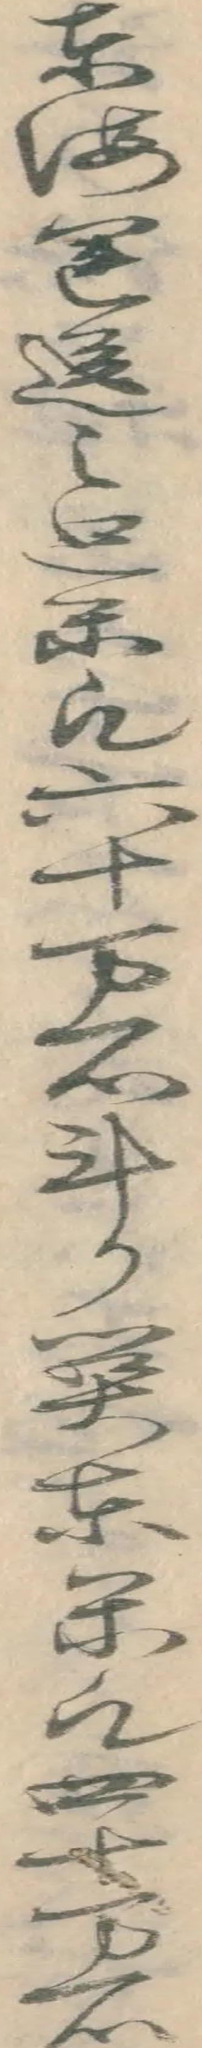東海運送之廻米凡六十万石計り関東米凡四十万石

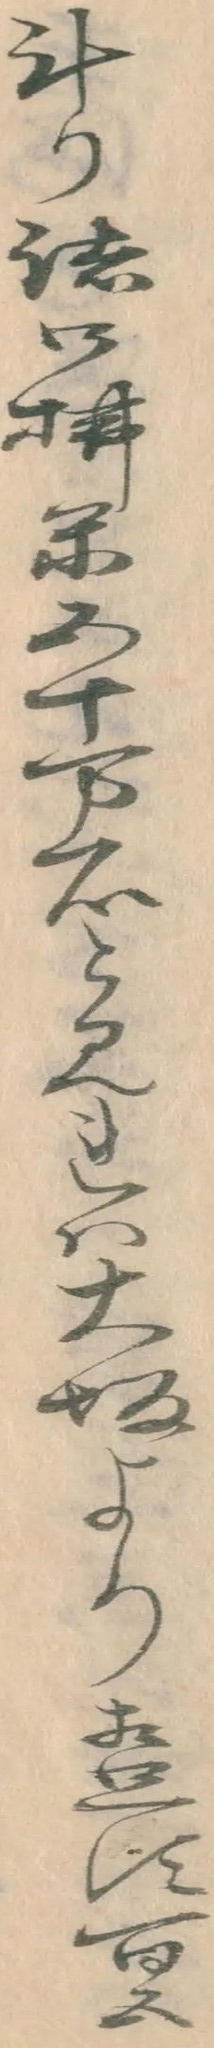計り諸口払米五十万石と見れは大坂より相廻す百五
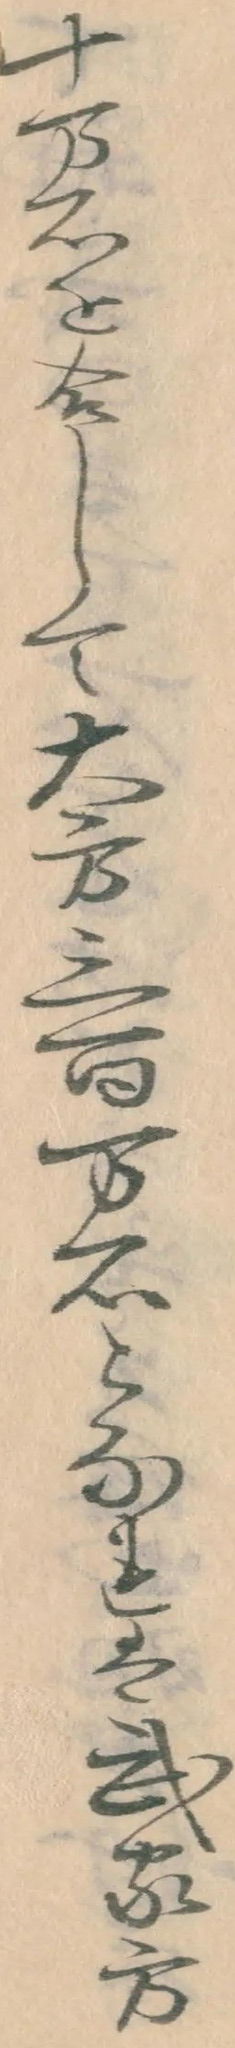十万石を合して大方三百万石となれは武家方
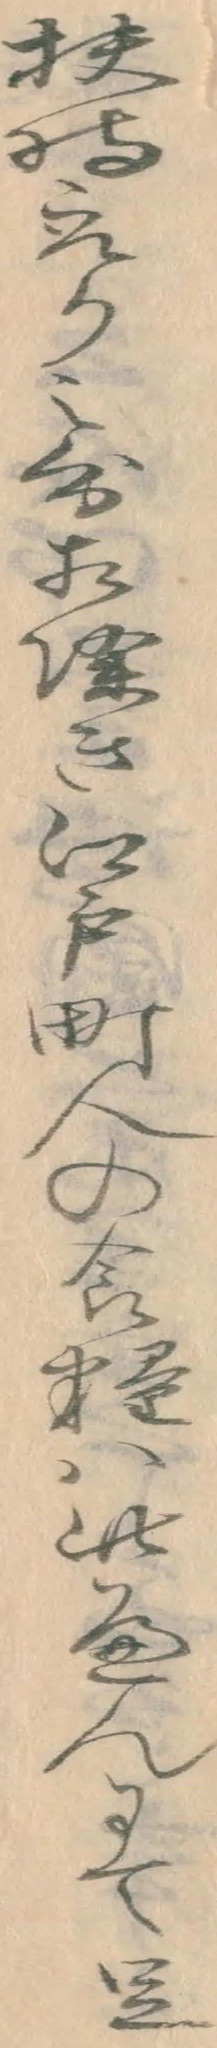扶持取り之分相除き江戸町人の食糧は此へんにて足
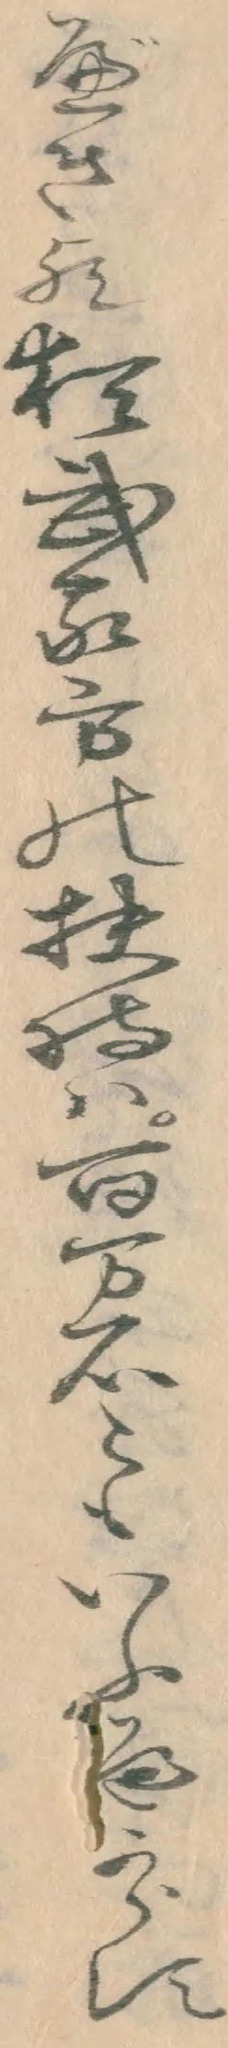べき歟猶武家方の扶持は。百万石ともいふへからす
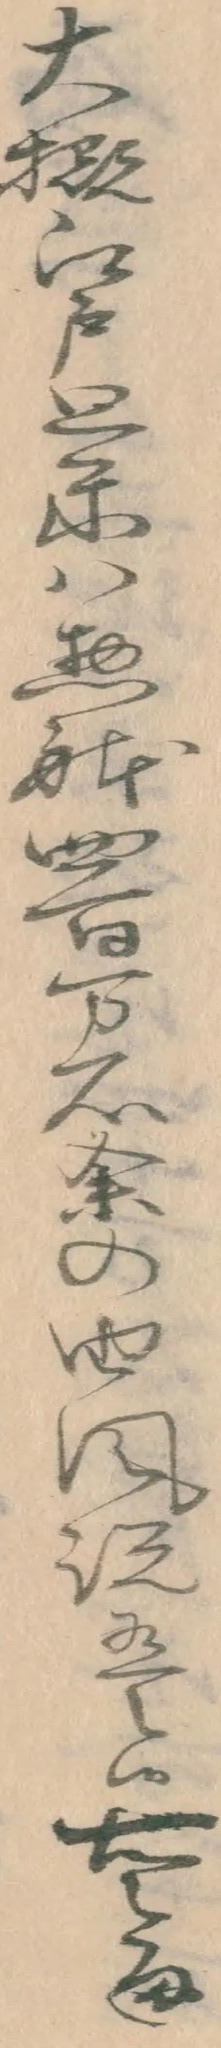大概江戸廻米は惣体四百万石余の由風説有之候右之通
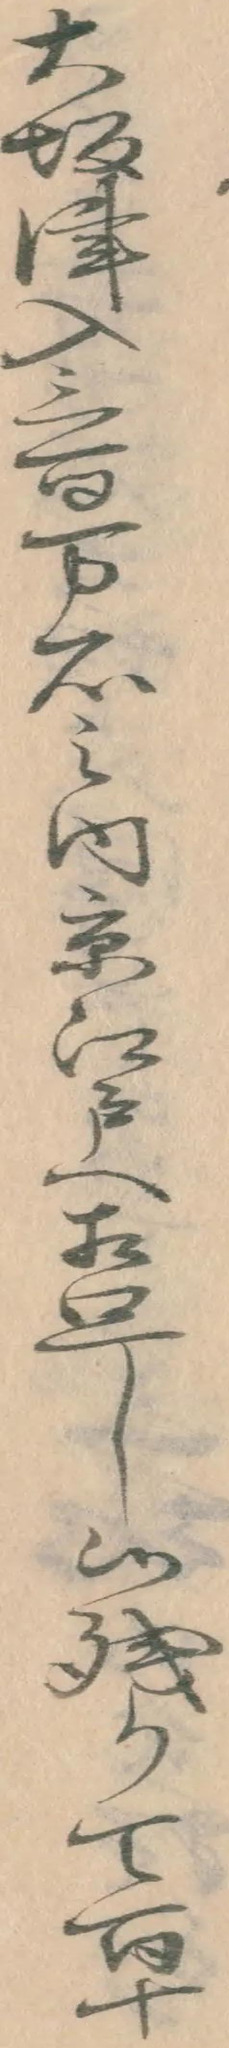大坂津入三百万石之内京江戸へ相廻し候残りて百十
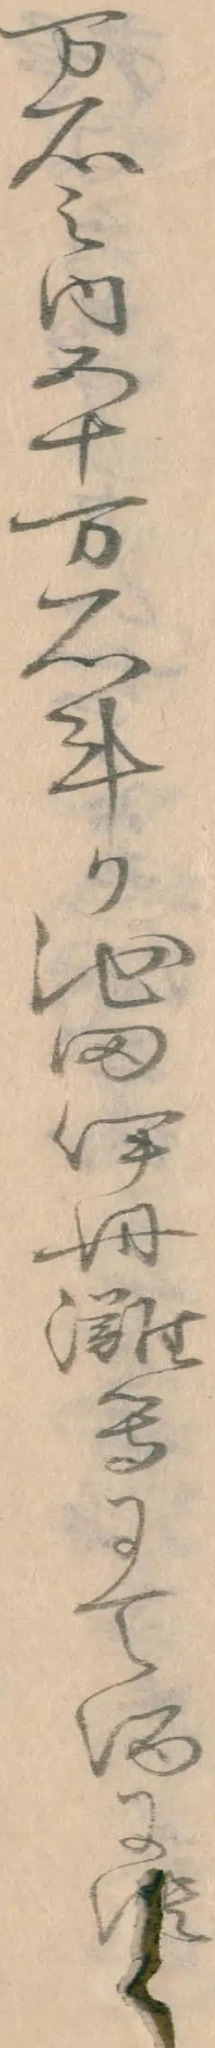万石之内五十万石計り池田伊丹灘等にて酒に潰
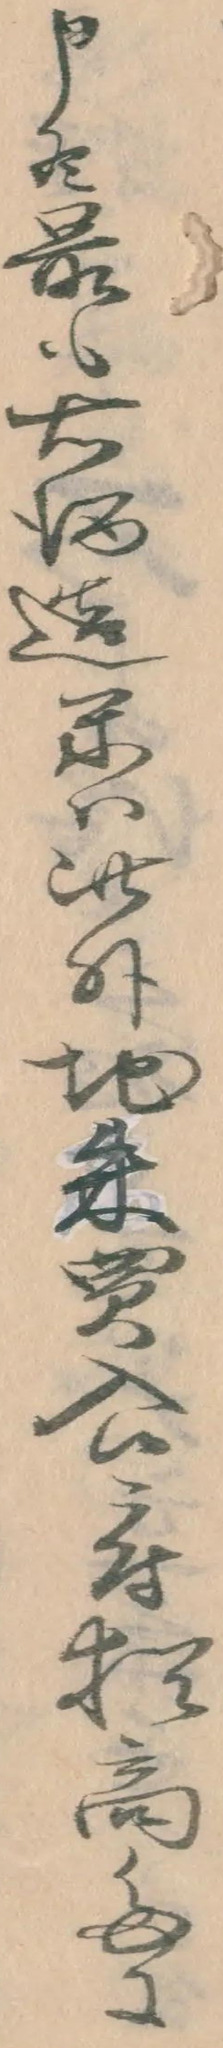申候最も右酒造米は此外地米買入候に付猶商多に
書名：斎庭之穂
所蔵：国立国会図書館 National Diet Library, JAPAN
